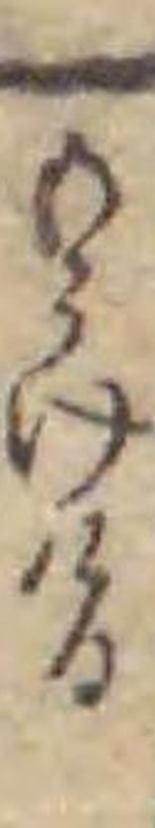もうけける
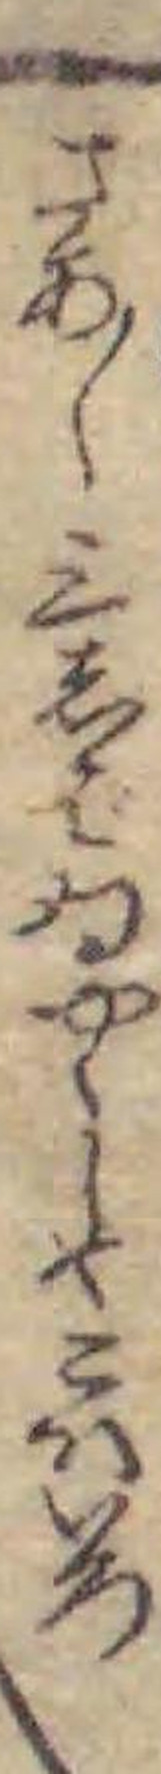さあ〳〵三しばゐやくしやこはいろ
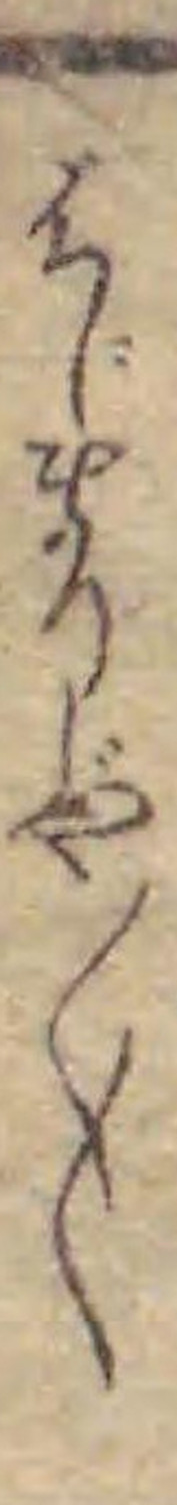はじまりじや〳〵〳〵

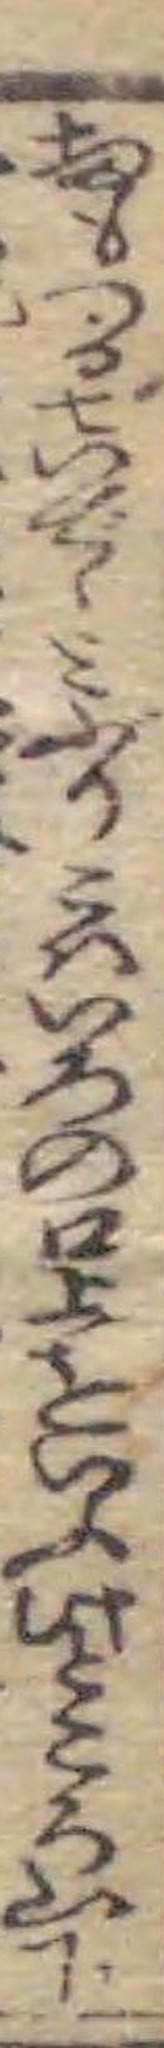扨もつる七いでゝみぶりこはいろの口上をいふ此ところ山下
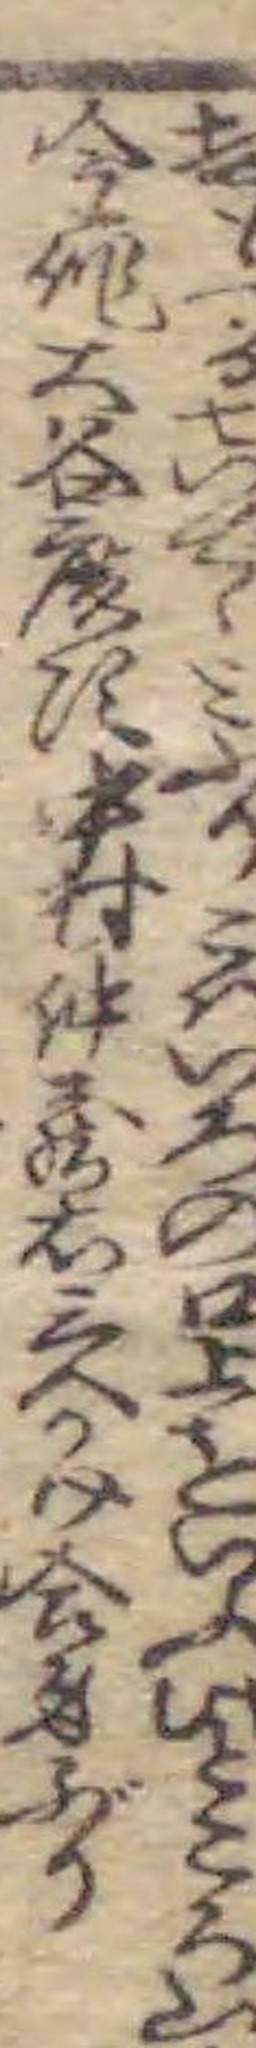金作大谷慶次中村仲蔵右三人かけ合身ぶり
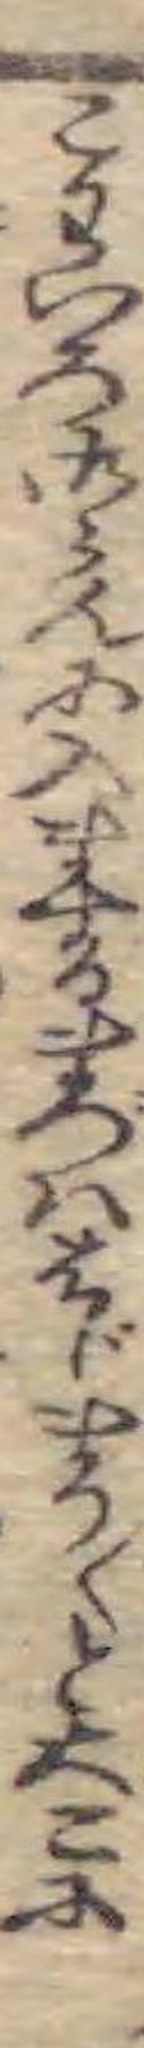こわいろ御らんに入まするまづははじまり〳〵と大こに
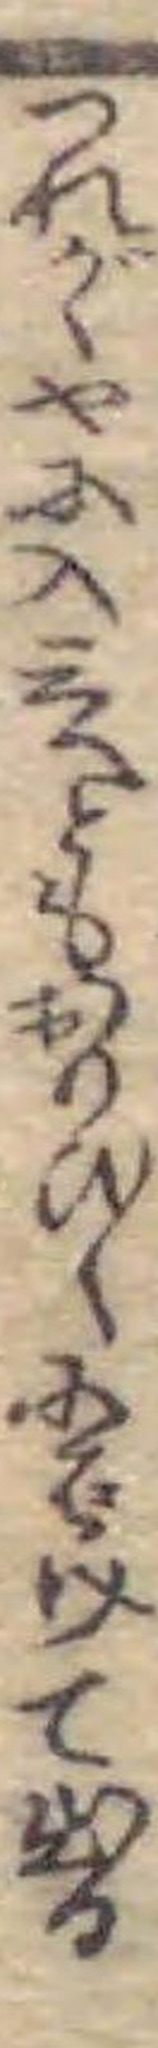つれがくやに入三人ともおもひ〳〵にばけて出る
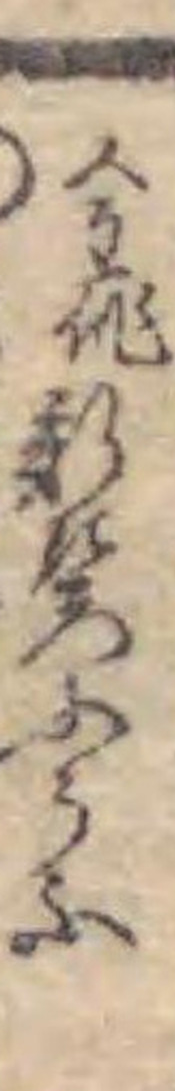金作新左衛門ふうふ
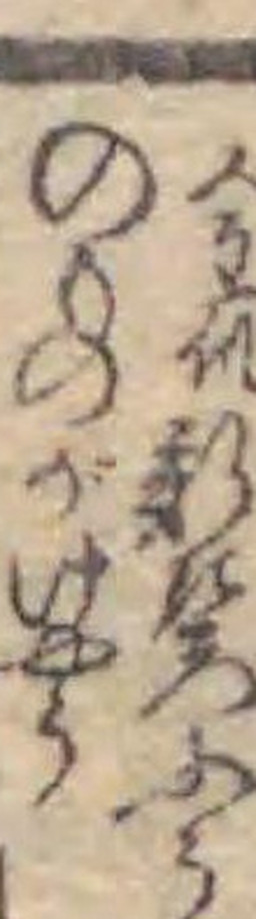のものが此やう
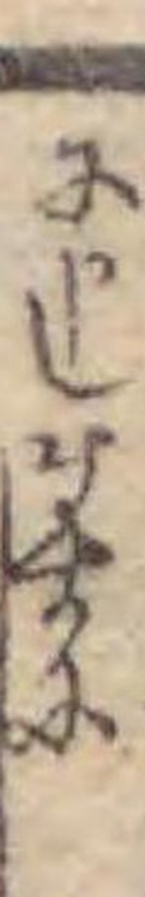に申しますに
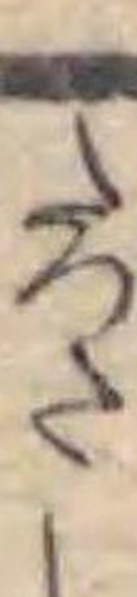たつた
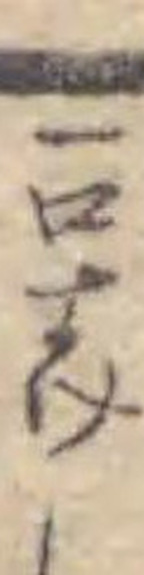一口すけ
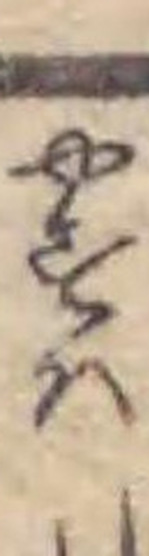やすは
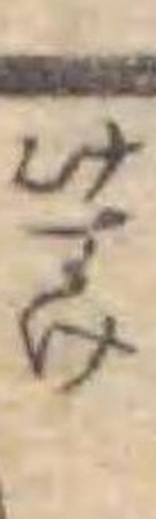此すけ
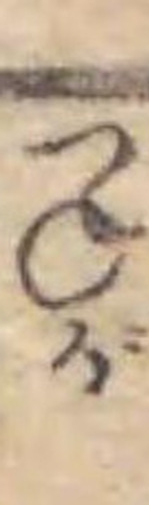つねが
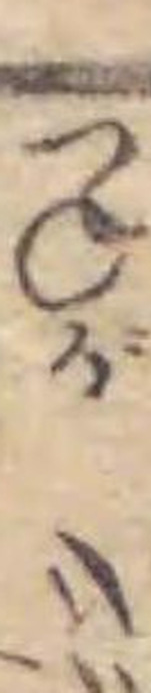つねが
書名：扨化狐通人 : 2巻
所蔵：国立国会図書館 National Diet Library, JAPAN
